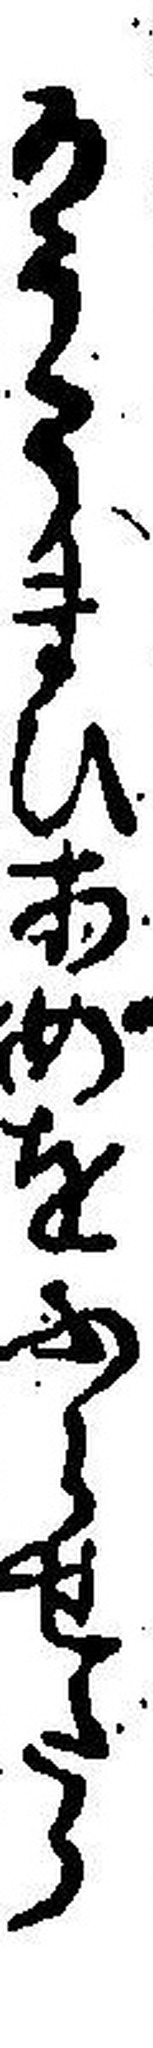かううまひあめをふらせたら
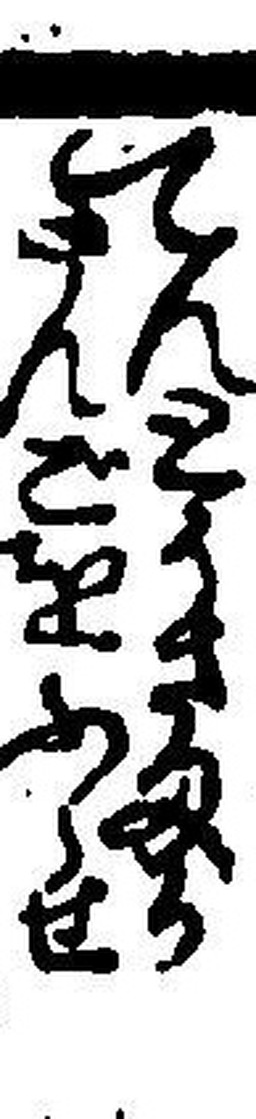たんごをふらせ
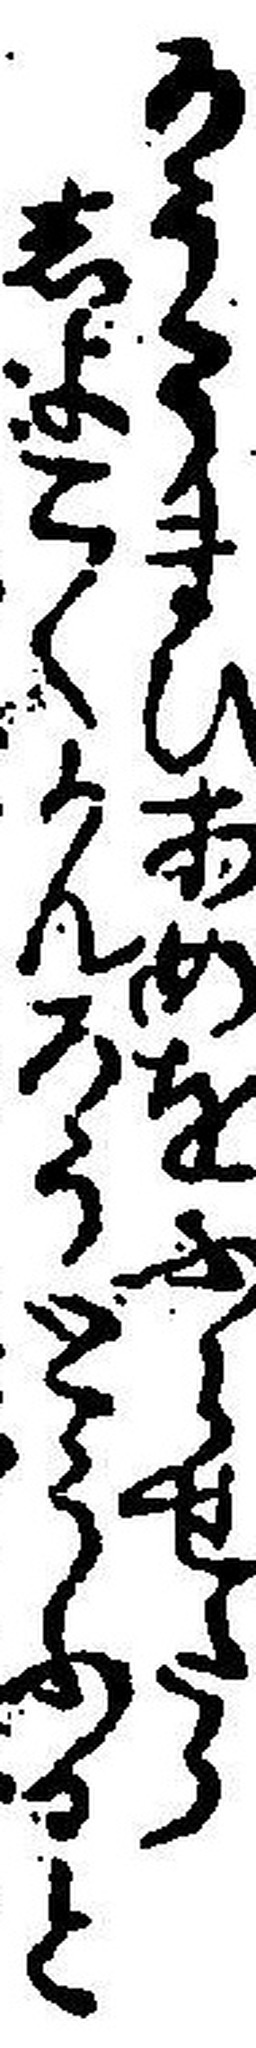しよこくかんろうとうふると
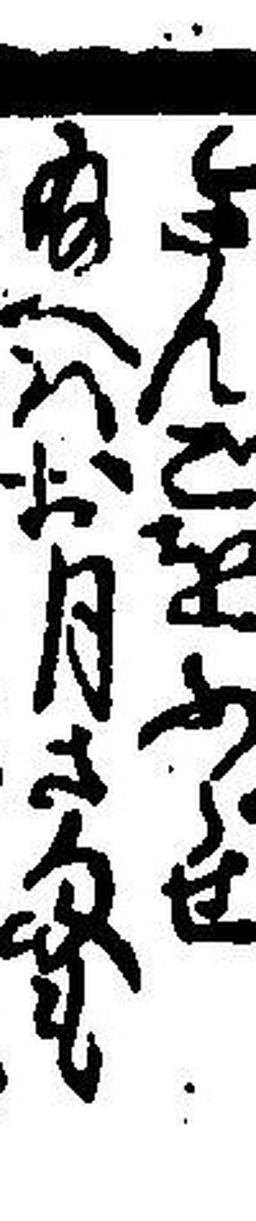給へはお月さまも
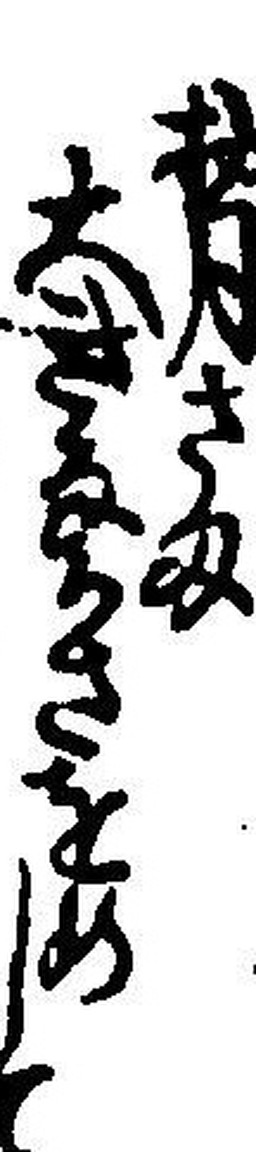大きなかさをめ
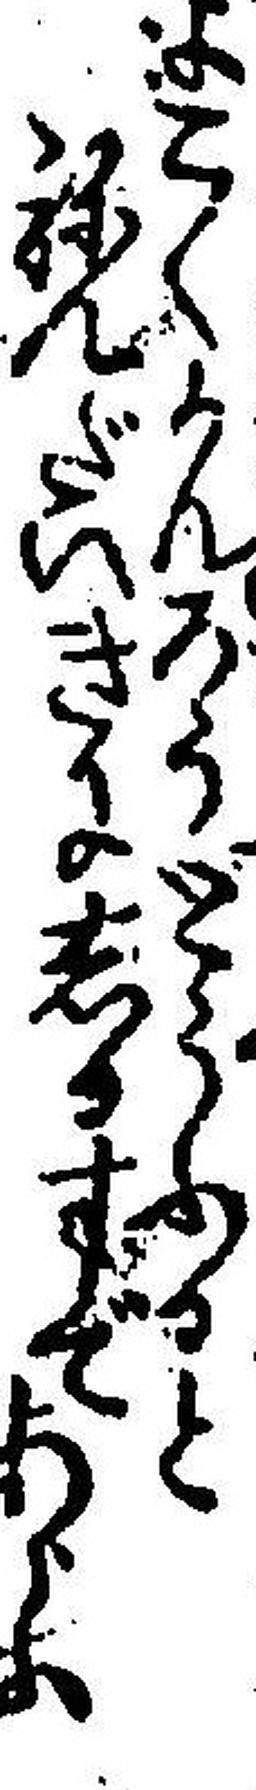ねんだいきにしるすであらふ
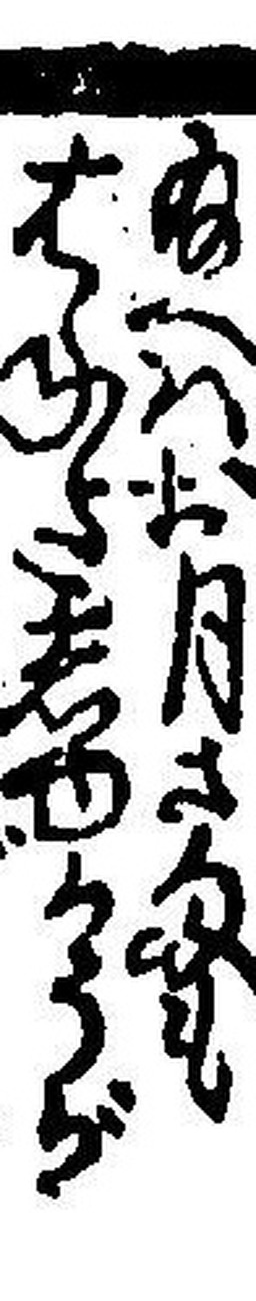はねたしゆかうが
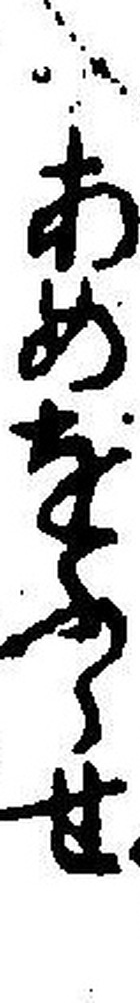あめをふらせ
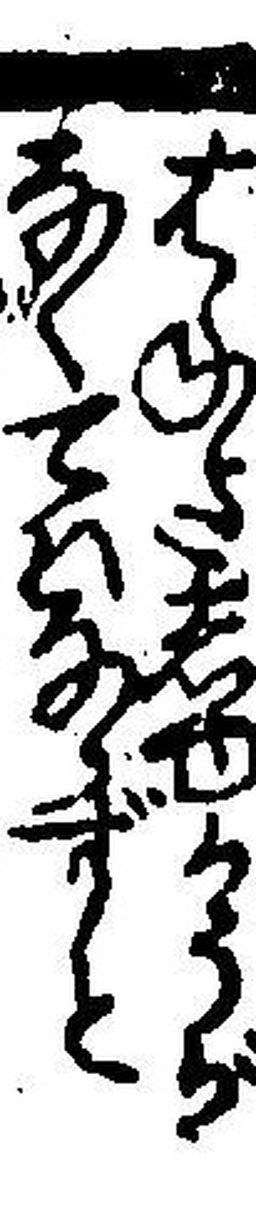なくてはならずと
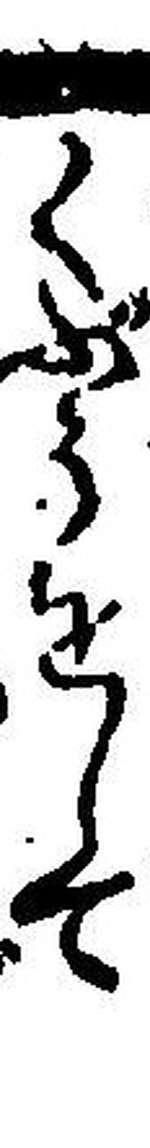くふうをして
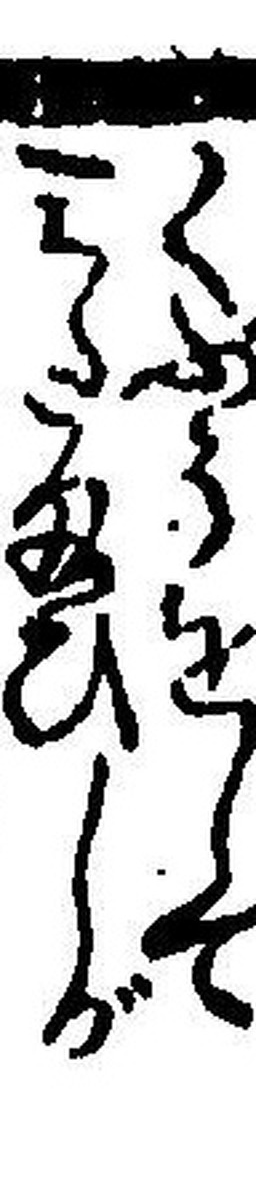みたまひしが
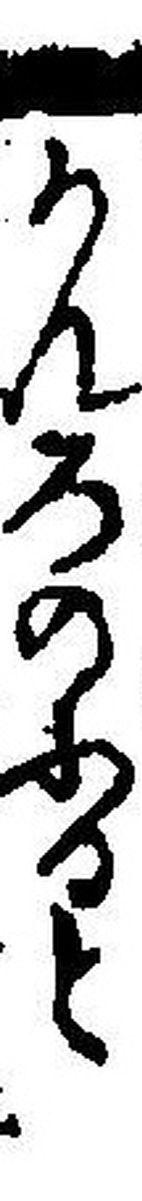かんろのふると
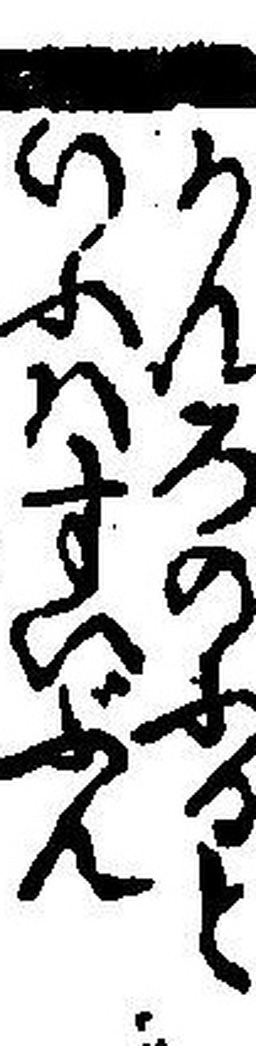いふはすいぶん
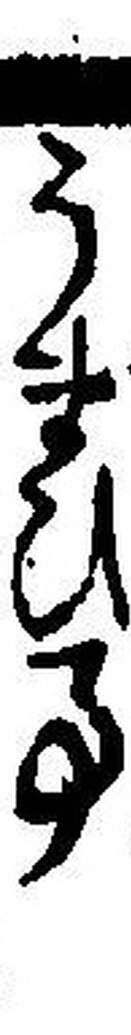うまひ事
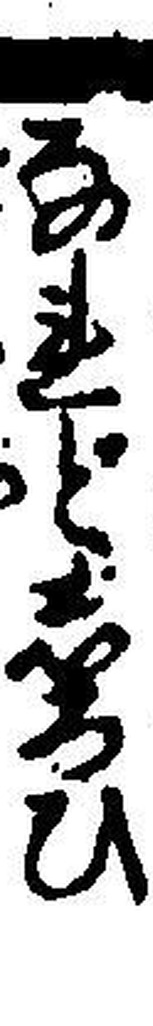なれどしろひ
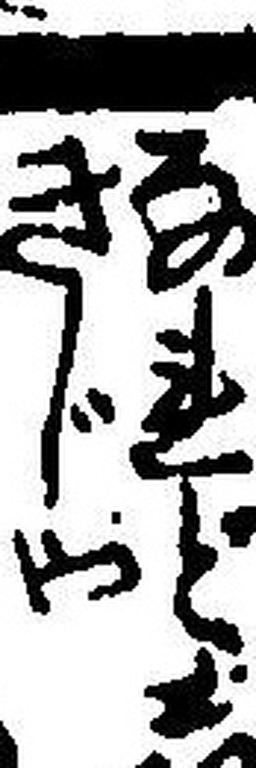きじや
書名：徳若水縁起金性 / 樹下石上作
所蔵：東京大学総合図書館 General Library in the University of Tokyo, JAPAN
